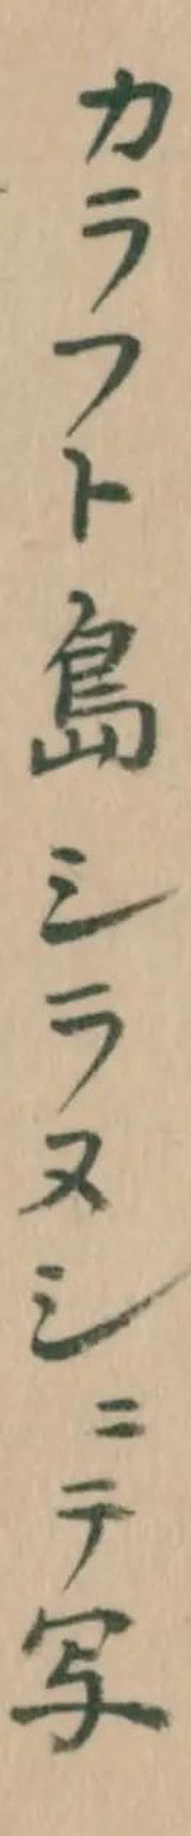カラフト島シラヌシニテ写
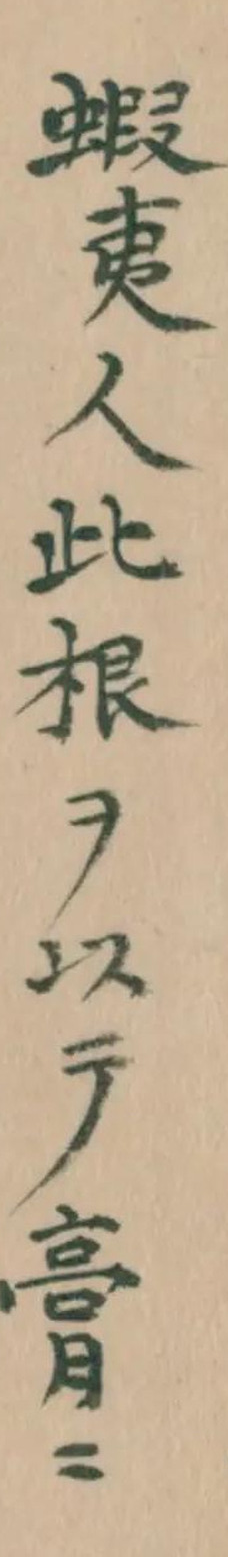蝦夷人此根ヲ以テ膏ニ
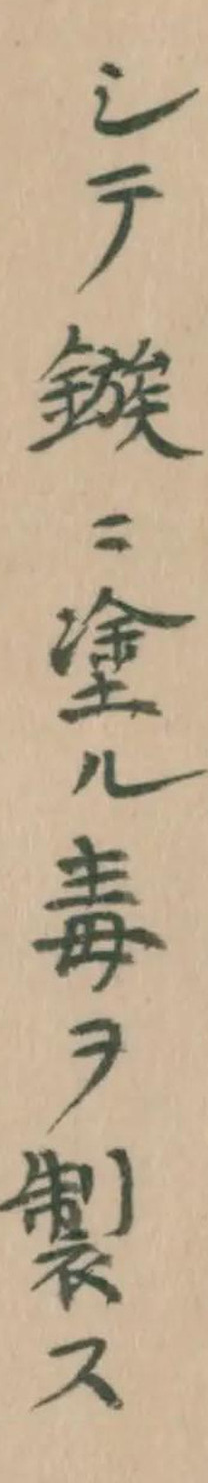シテ鏃ニ塗ル毒ヲ製ス
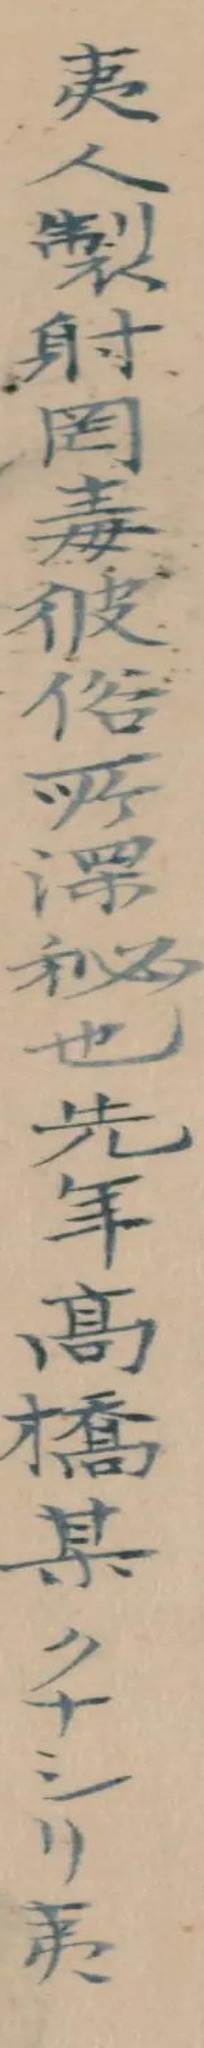夷人製射罔毒彼俗所深秘也先年高橋某クナシリ夷
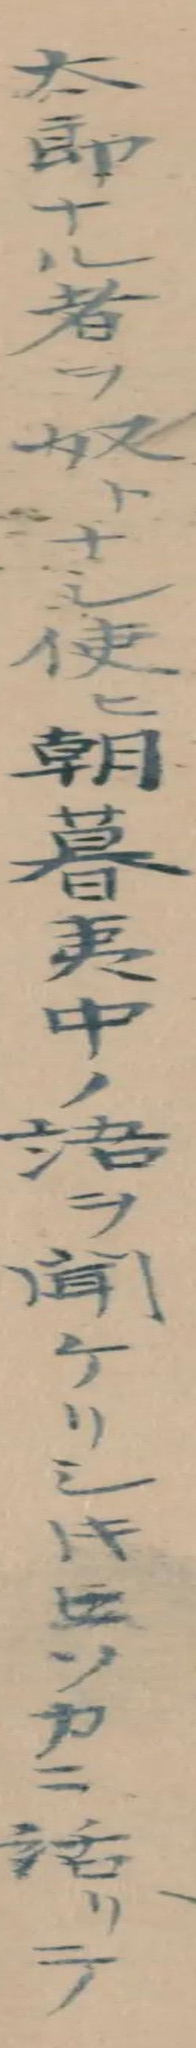太郎ナル者ヲ奴トナシ使ヒ朝暮夷中ノ語ヲ聞ケリシトキヒソカニ話リテ
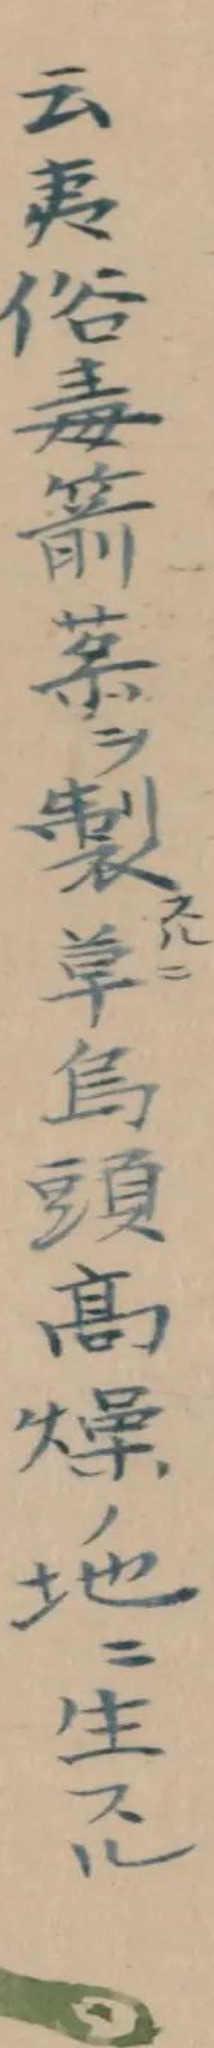云夷俗毒箭ヲ製草烏頭高燥ノ地ニ生スル
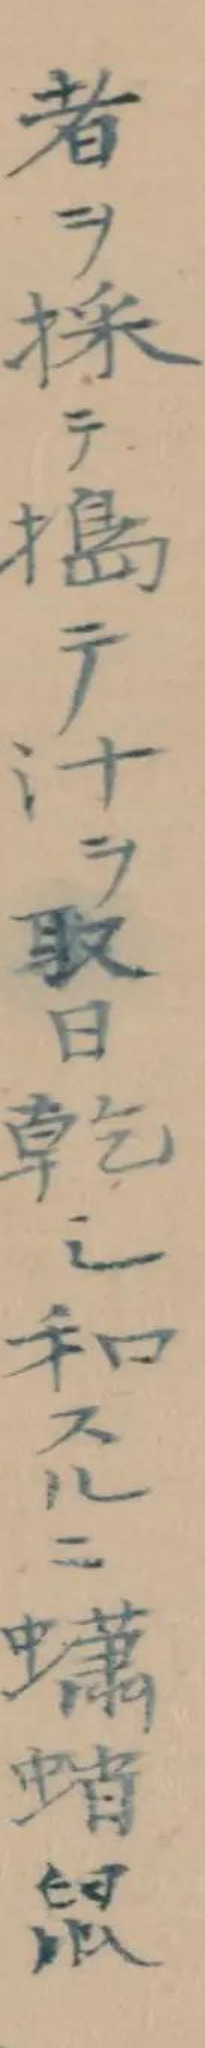者ヲ採テ搗テ汁ヲ取日乾シ和スルニ蠨蛸鼠
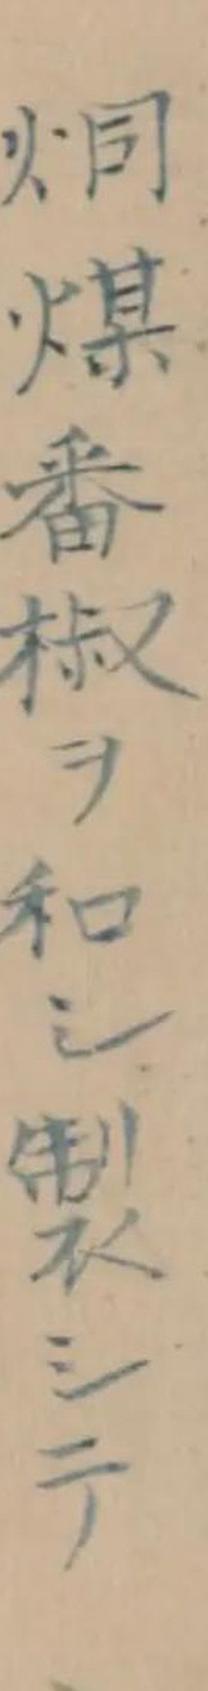烔煤番椒ヲ和シ製シテ
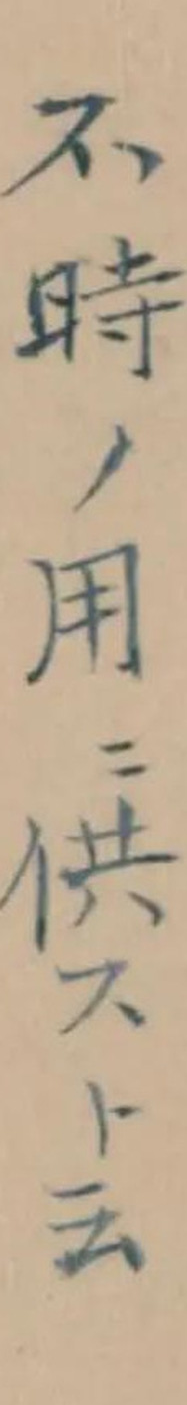不時ノ用供スト云
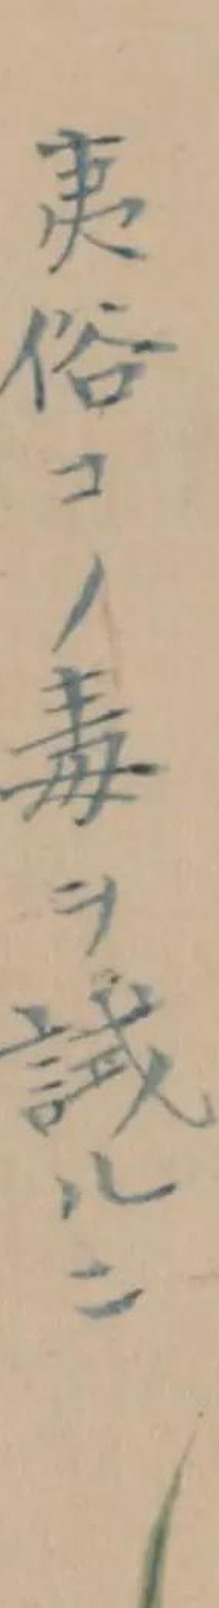夷俗コノ毒ヲ試ルニ
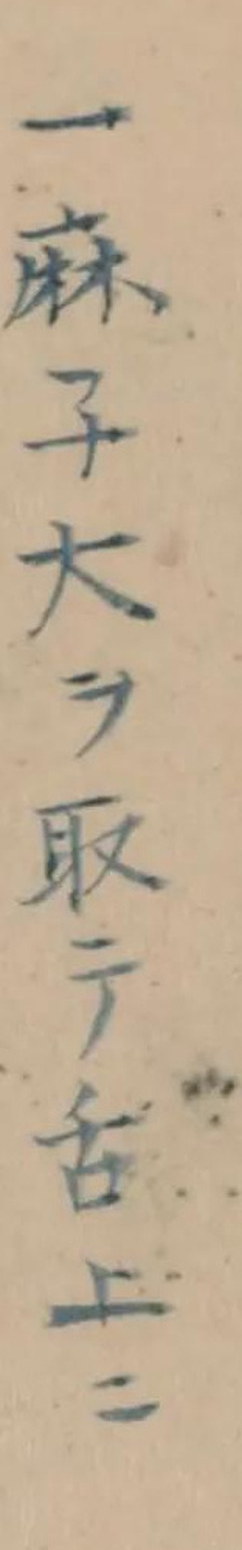一麻子大ヲ取テ舌上ニ
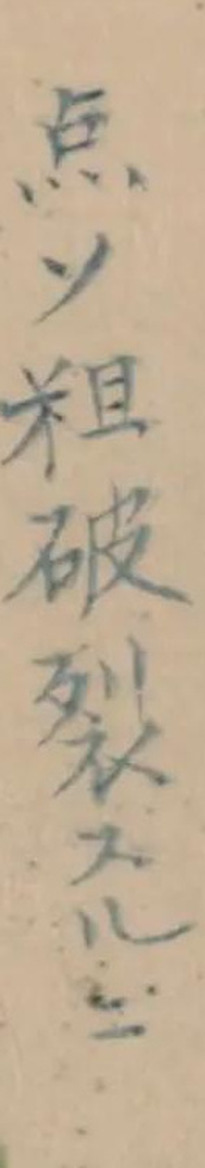点シテ粗破裂スルニ
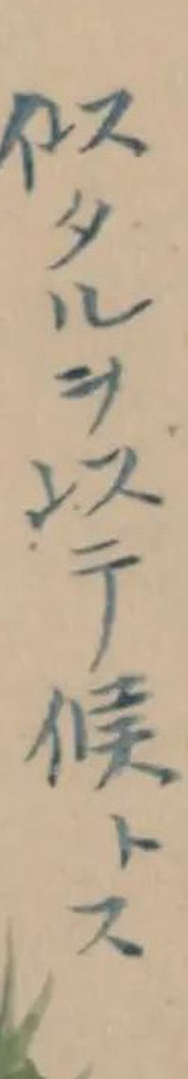似タルヲ以テ候トス
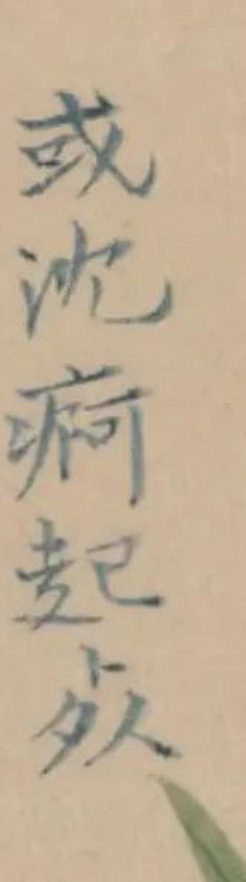或沈痾起死

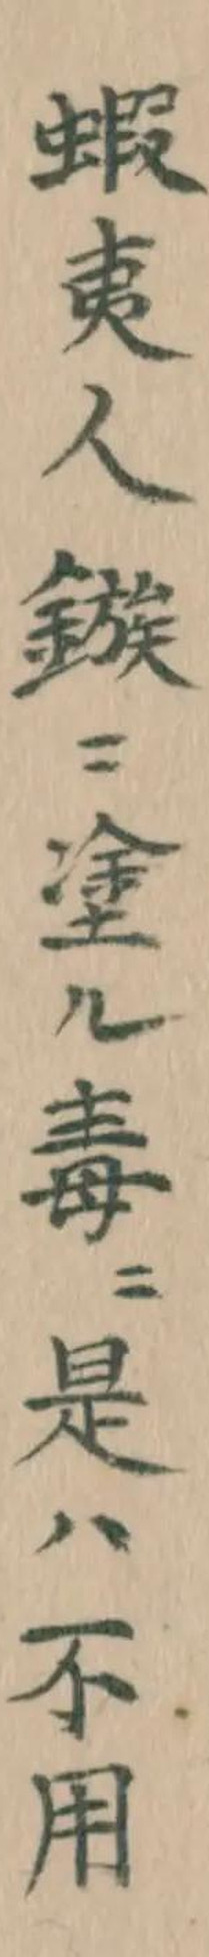蝦夷人鏃ニ塗ル毒ニ是ハ不要

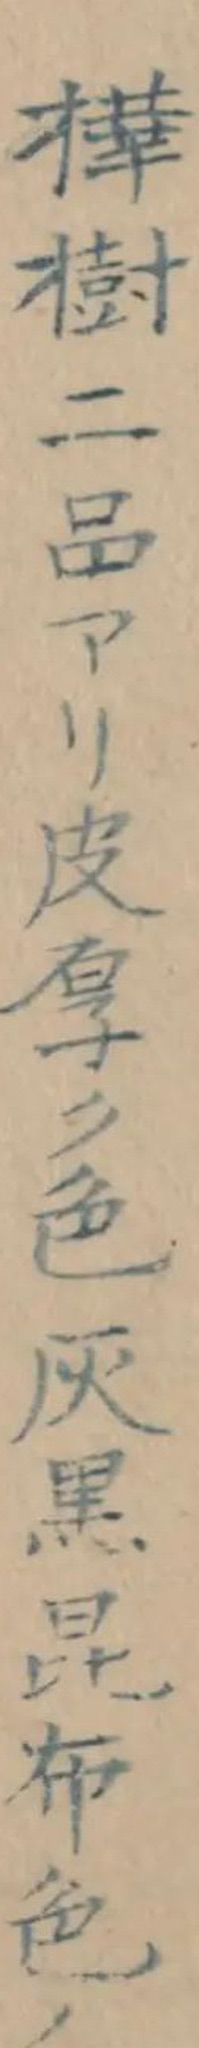樺樹二品アリ皮厚ク色灰黒昆布色ノ
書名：蝦夷草木図
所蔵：国立国会図書館 National Diet Library, JAPAN
